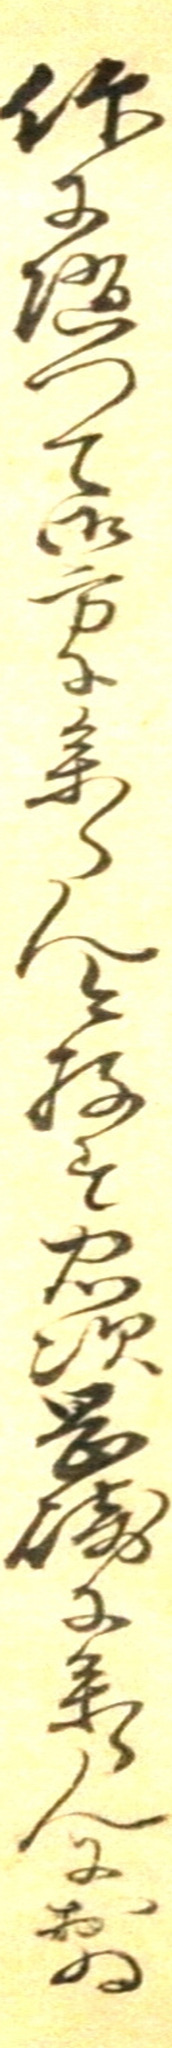仰に随つて御方に参らんと存す忠次岡崎に参らんにおゐ
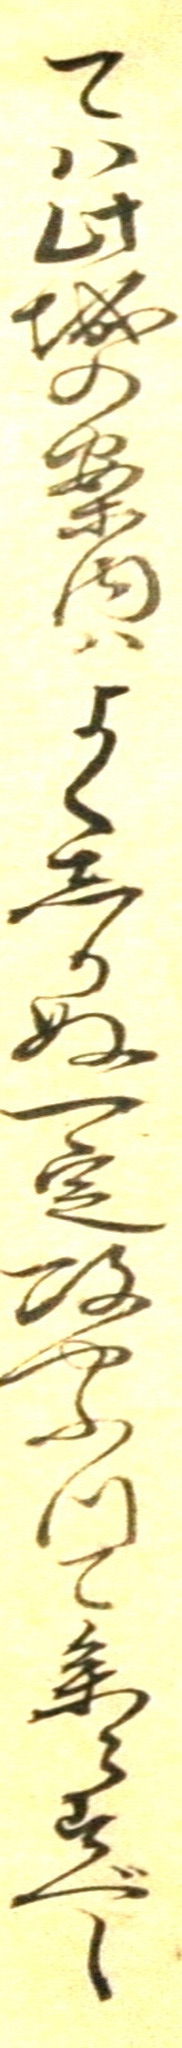ては此城の案内はよくしりぬ一定攻やふつて参らすべし

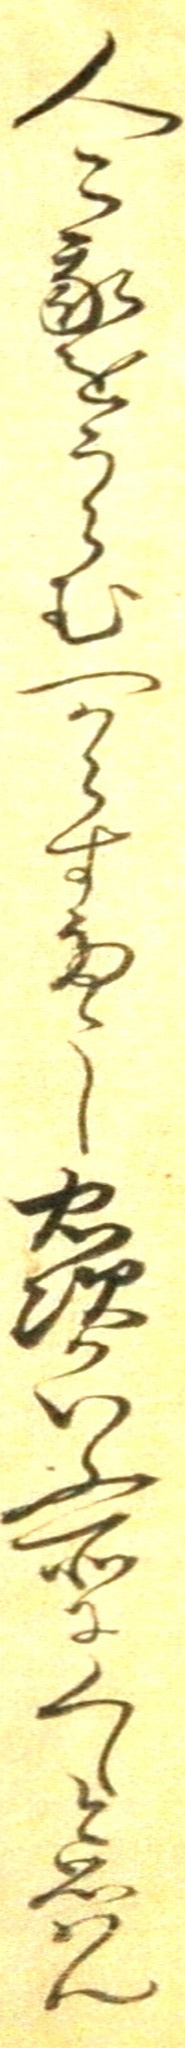人々我をうらむへからすたゝし忠次かいふ所にくしと思はん
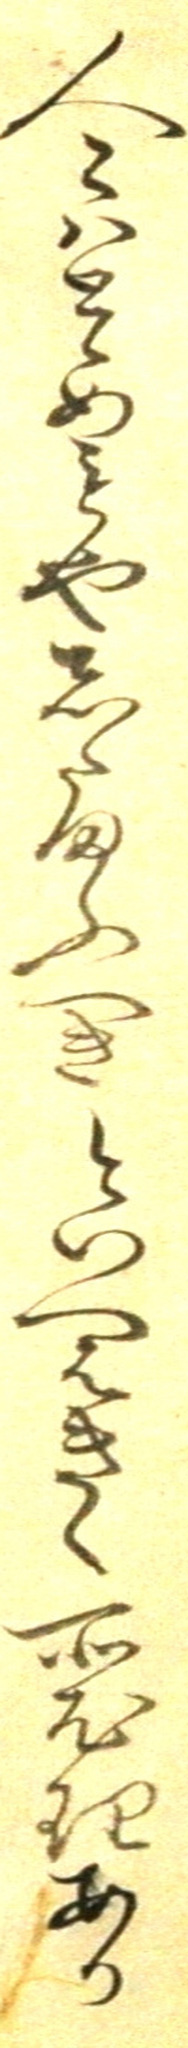人々はとゝめもやしたまふへきといへはきく所尤理あり
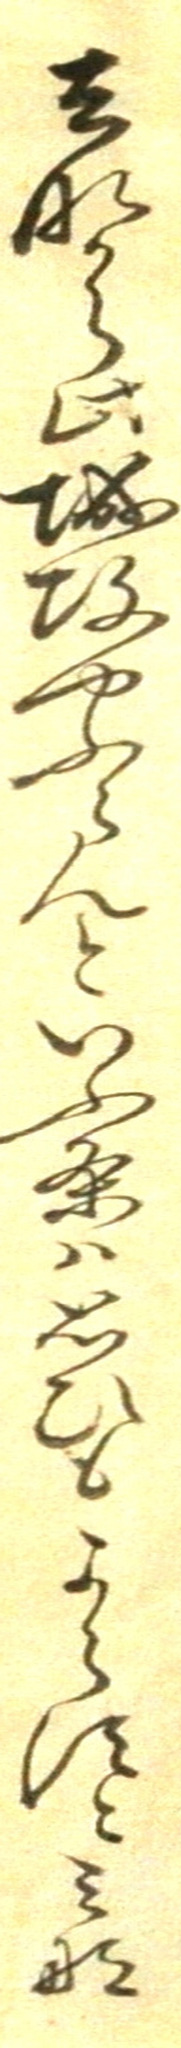去なから此城攻やふらんといふ条は思ひもよらすとみな
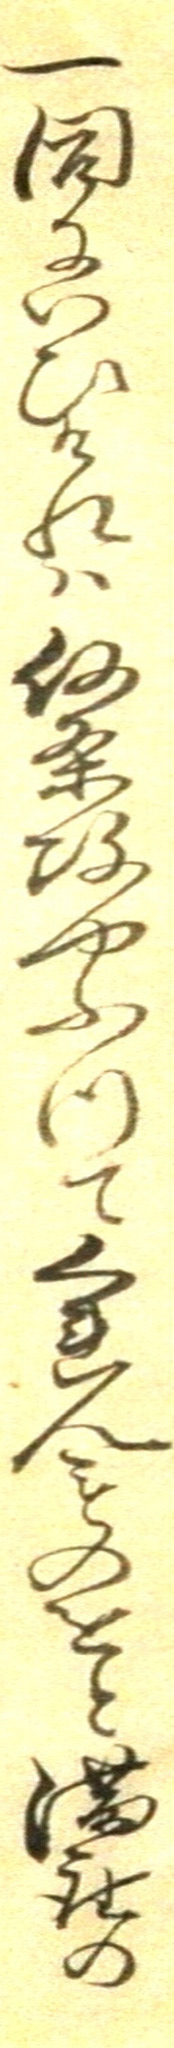一同にいひけれは何条攻やふつてくれんものをと満座の
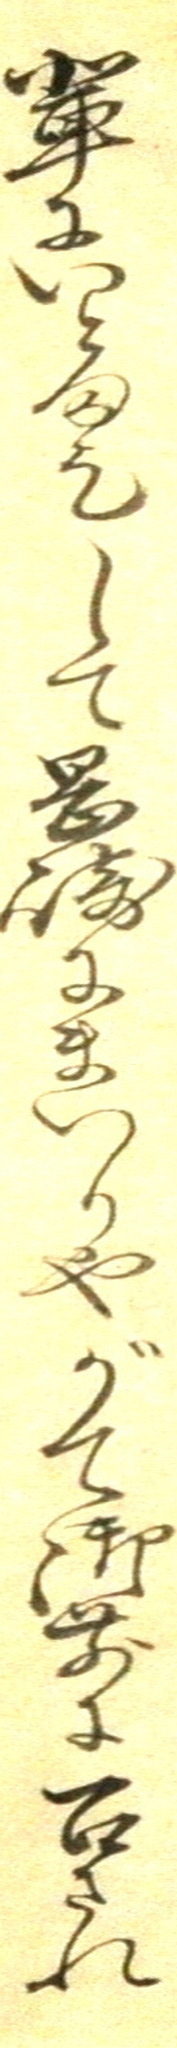輩にいとま乞して岡崎にまいりやがて御前に召され
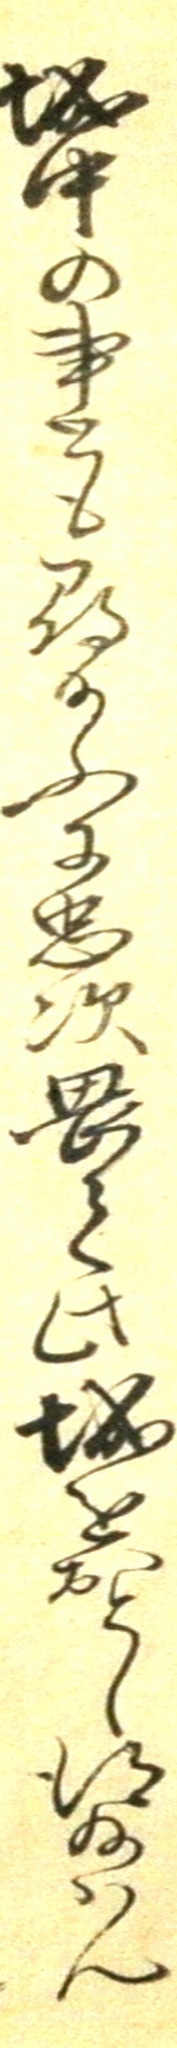城中の事とも尋給ふに忠次畏て此城をおとし得給はん
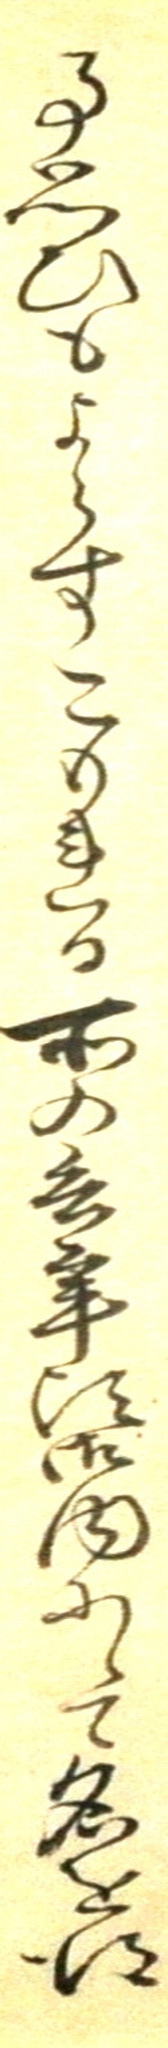事思ひもよらすこもれる所の兵年頃御内にして名を得
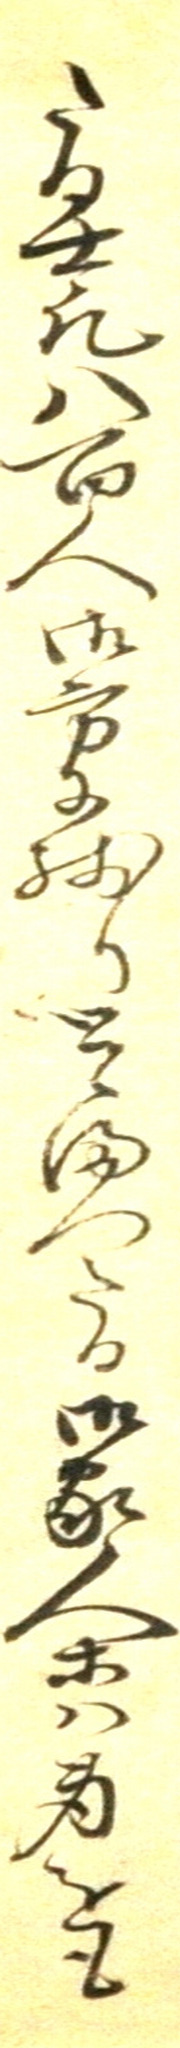たる士凡八百人御方に残りとゝまつたる御家人等は身をも
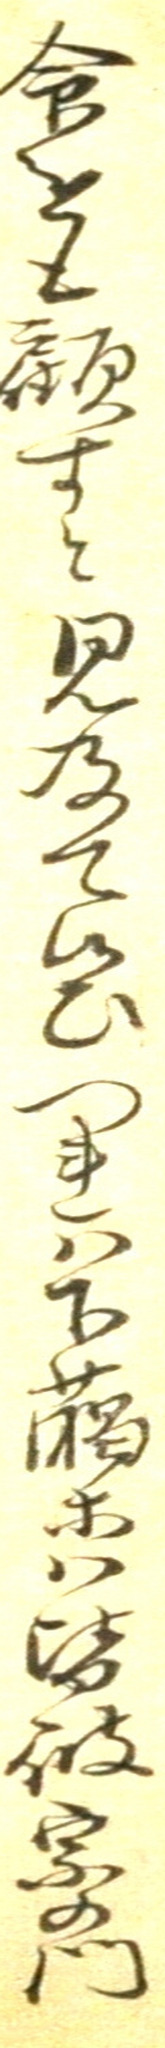命をも顧すと見及て候ひつれは下﨟等は皆彼宗の門
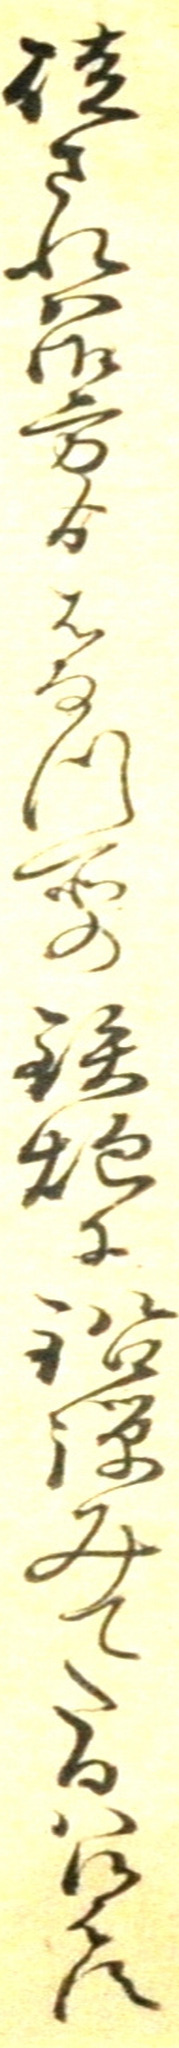徒されは御方よりはなつ所の鉄炮に鉛弾みてたるは候はす
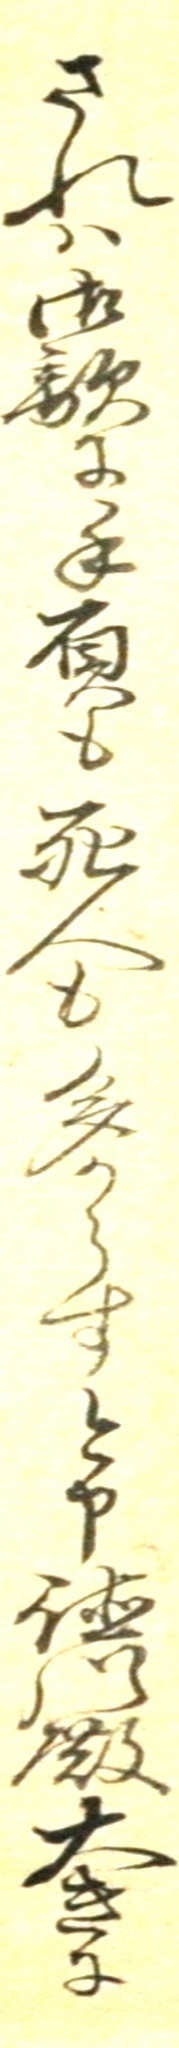されは御敵に手負も死人も多からすと申徳川殿大きに
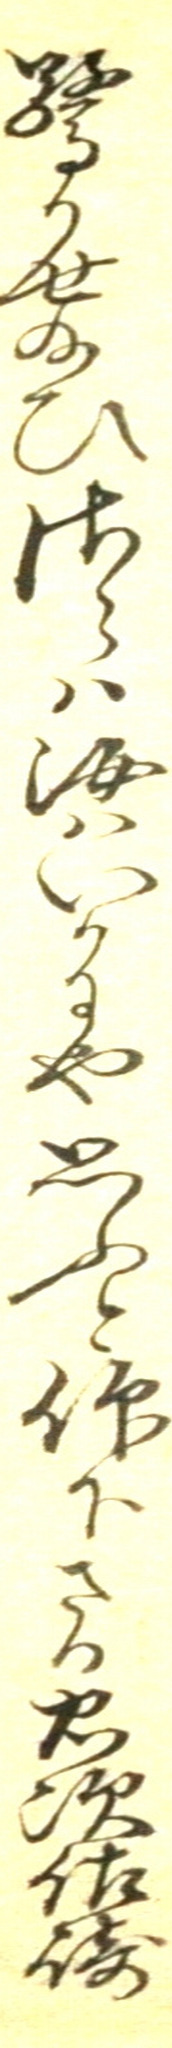驚かせ給ひさらは汝はいかにや思ふと仰下さる忠次佐崎
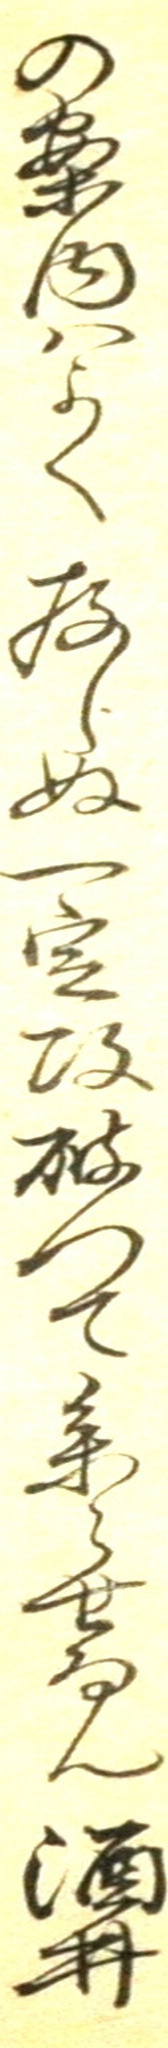の案内はよく存しぬ一定攻破つて参らせなん酒井
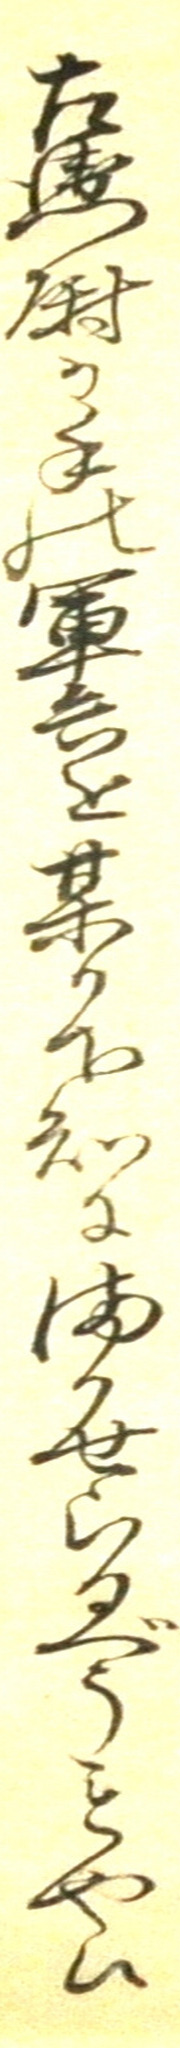左衛門尉か手の軍兵を某か下知にまかせらるべうことや候
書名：藩翰譜（四・下）
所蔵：伊那市立高遠町図書館・合同会社AMANE
